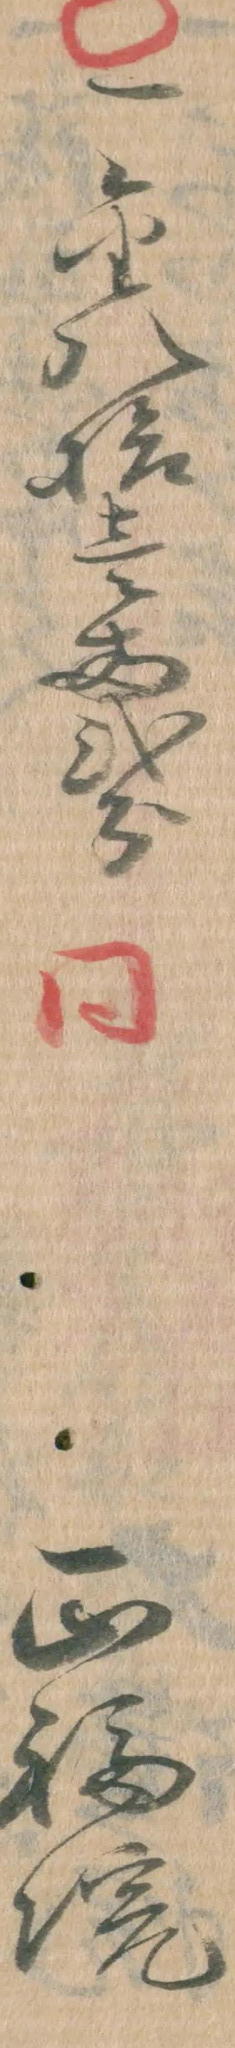一金八拾壱両弐分同正福院

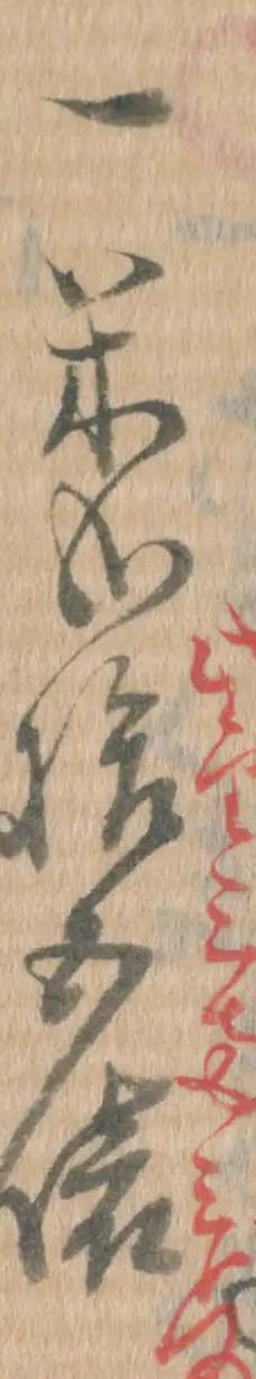一米弐拾五俵
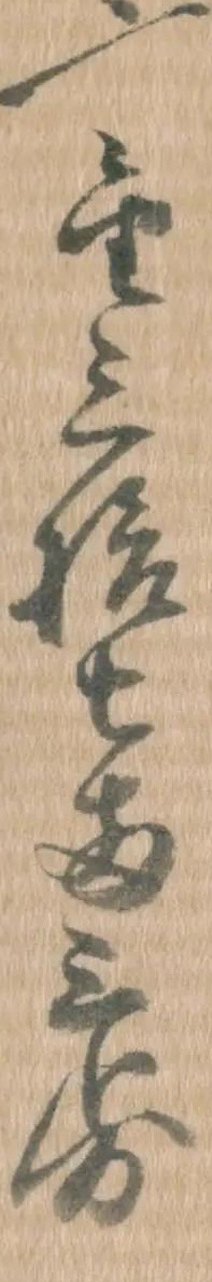〆金三拾七両三歩
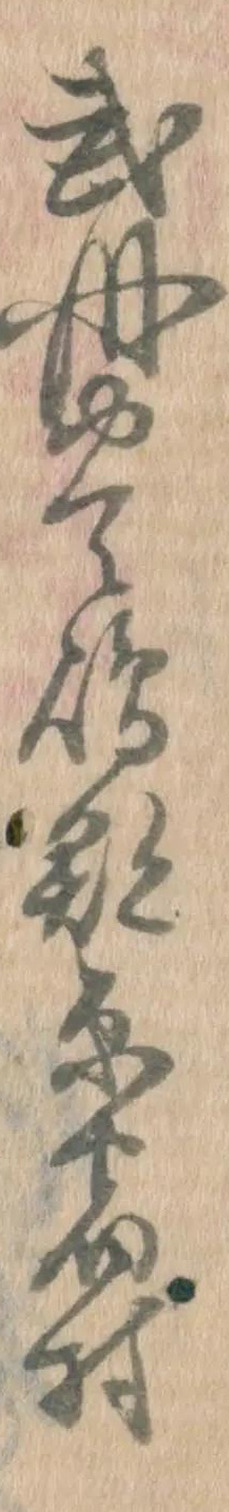同武州豊島郡原宿村

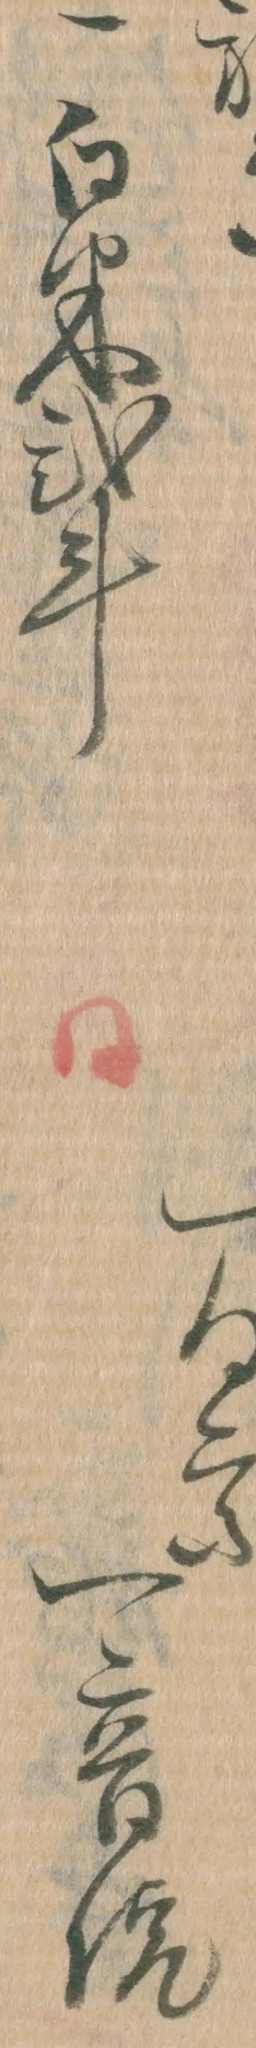一白米弐斗一向宗
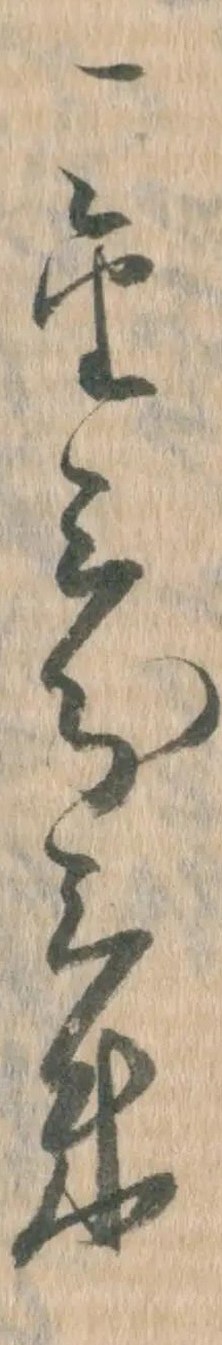一金三分三朱同

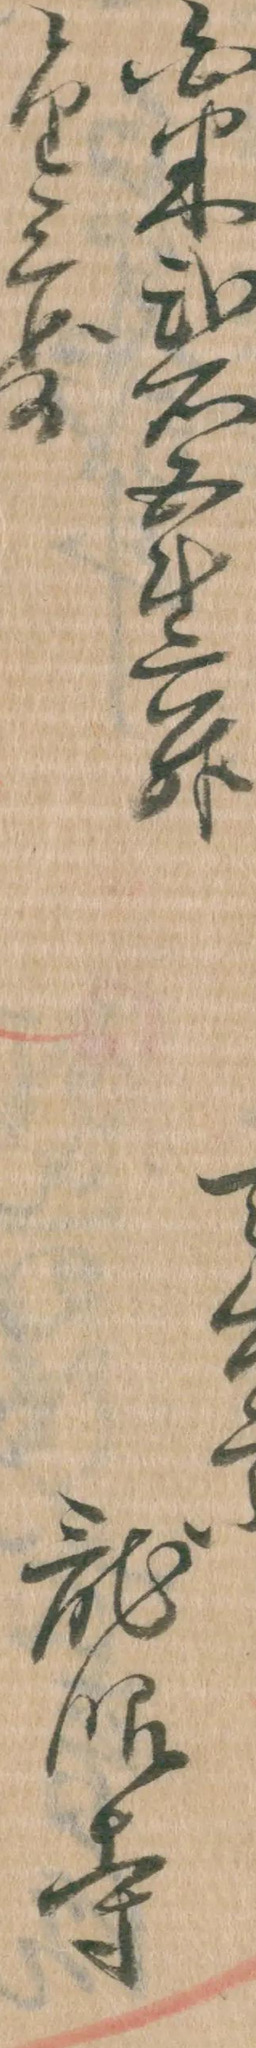一白米弐石五斗六升天台宗
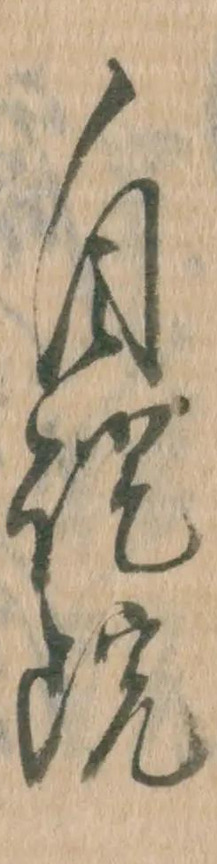自証院
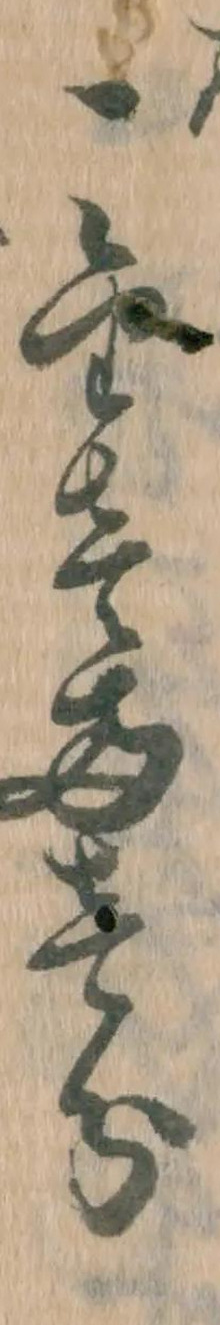一金壱両壱分同
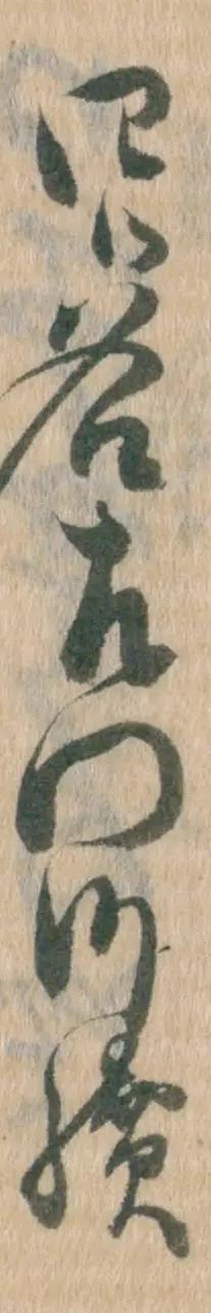施高四ツ谷左門町続
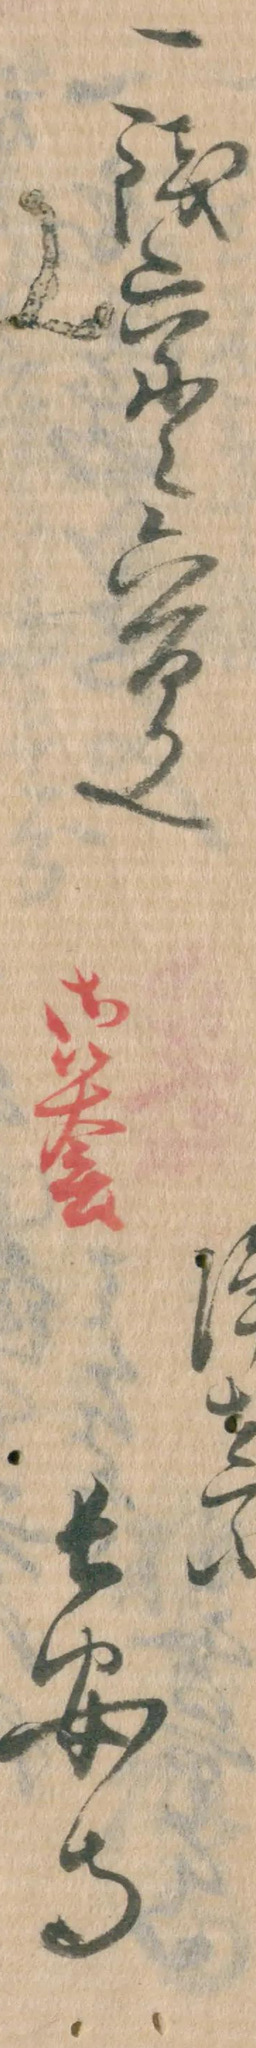一銭六貫六百文浄土宗

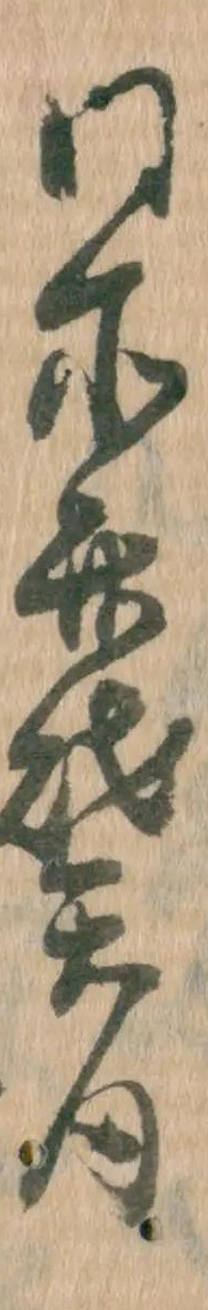同同所弁財天町
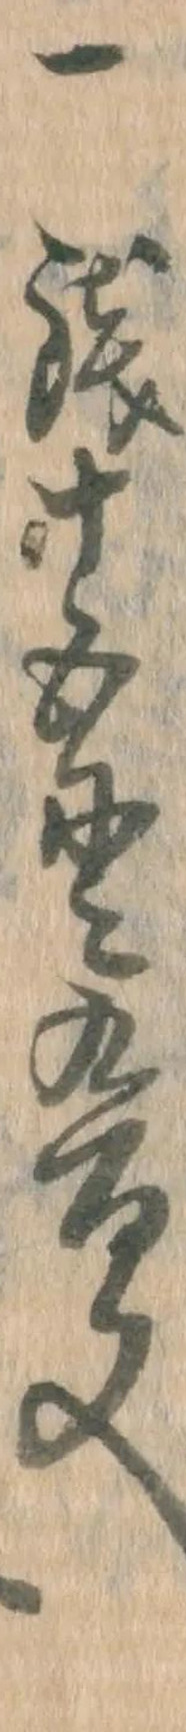一銭十五貫九百文
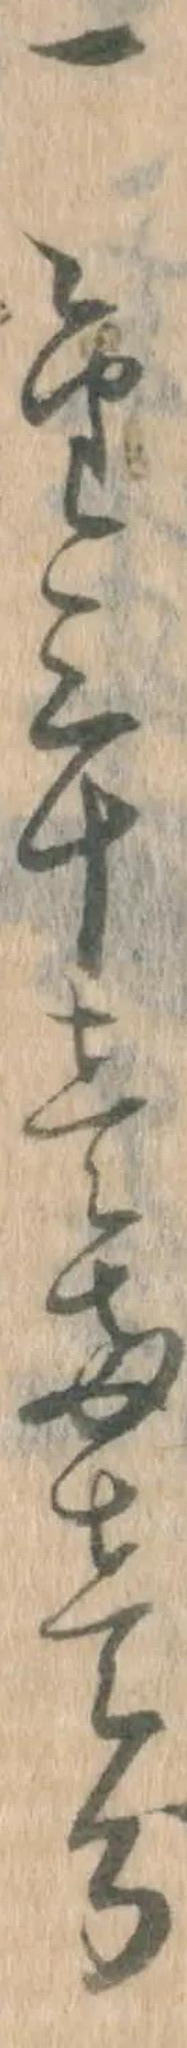一金三十壱両壱分
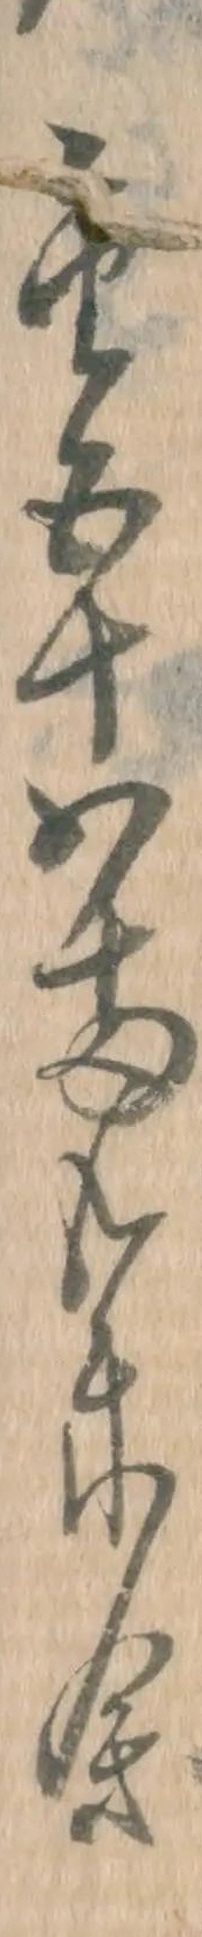〆金五十八両弐朱余

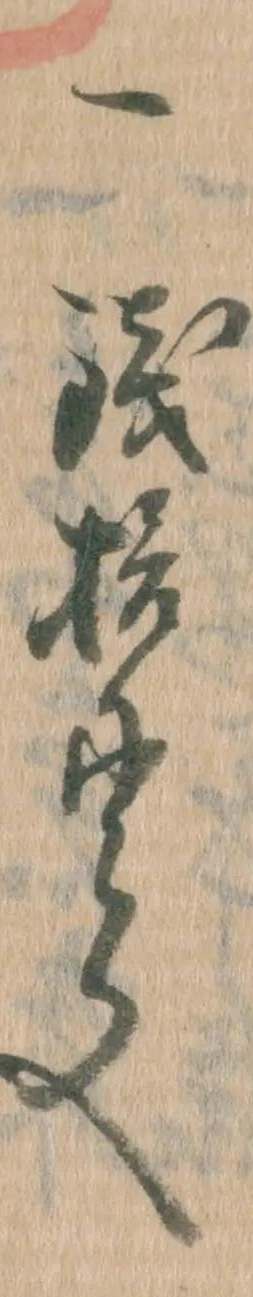一銭拾貫文
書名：武家方并寺院等ニテ施差出候一件
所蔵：国立国会図書館 National Diet Library, JAPAN
